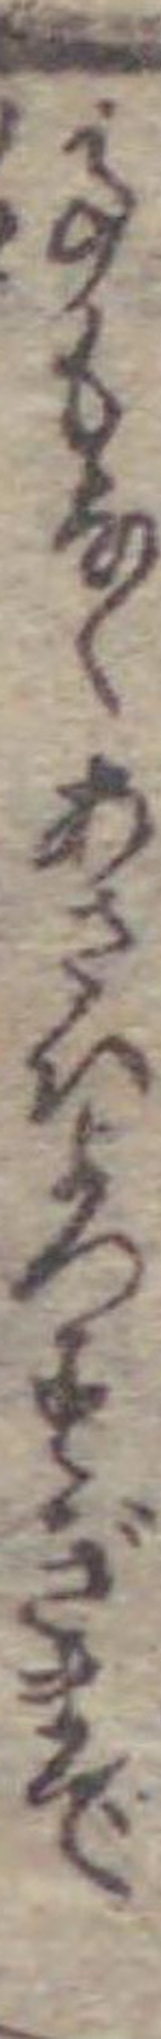事もなくあさはよつすぎまで
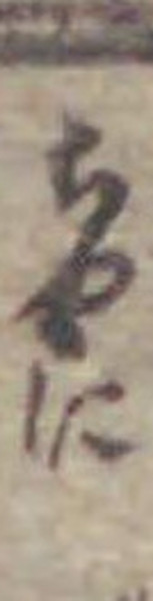ちやに
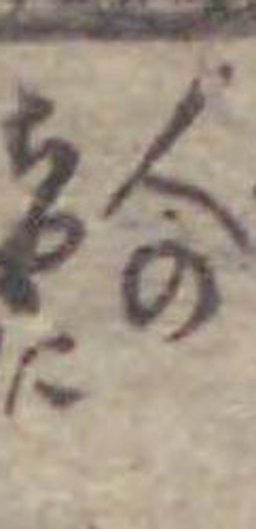ちやに
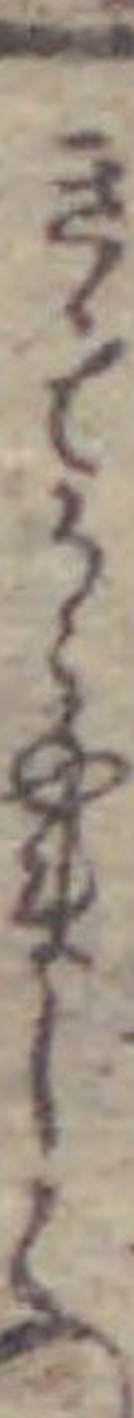きゝてうらやましく
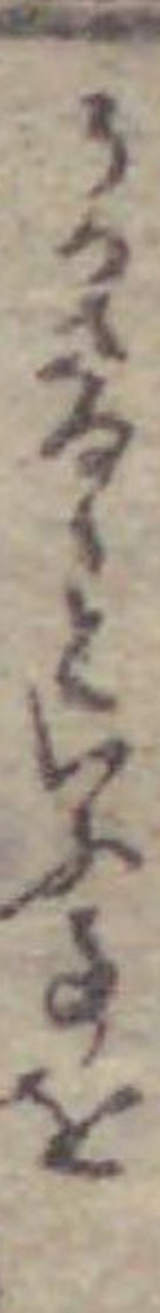うかさるゝといふ事を
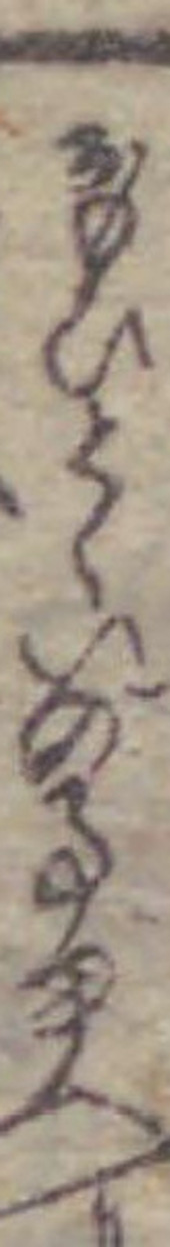おもひとくいの事ゆへ
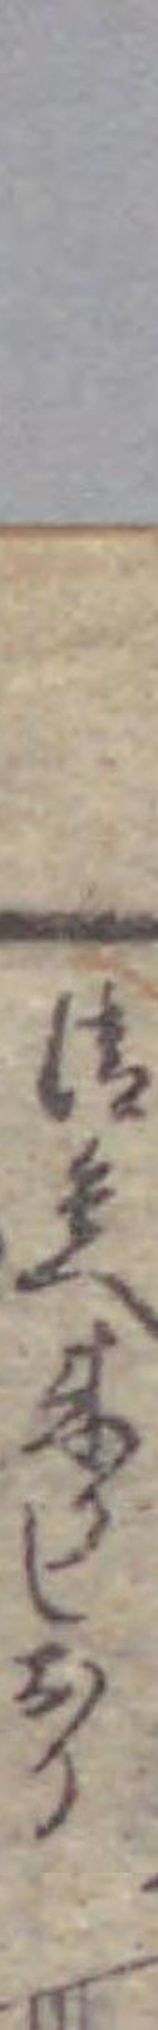清兵へ
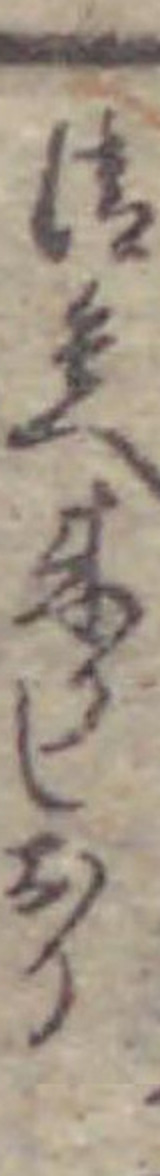清兵へ来りしおり
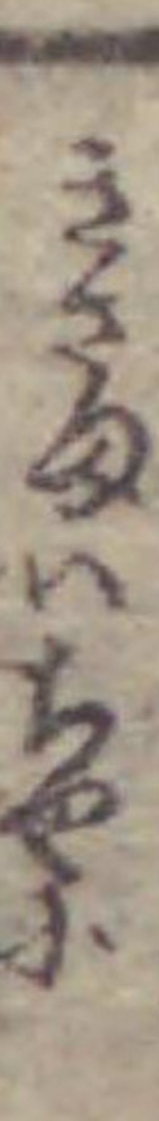きさまはちやに
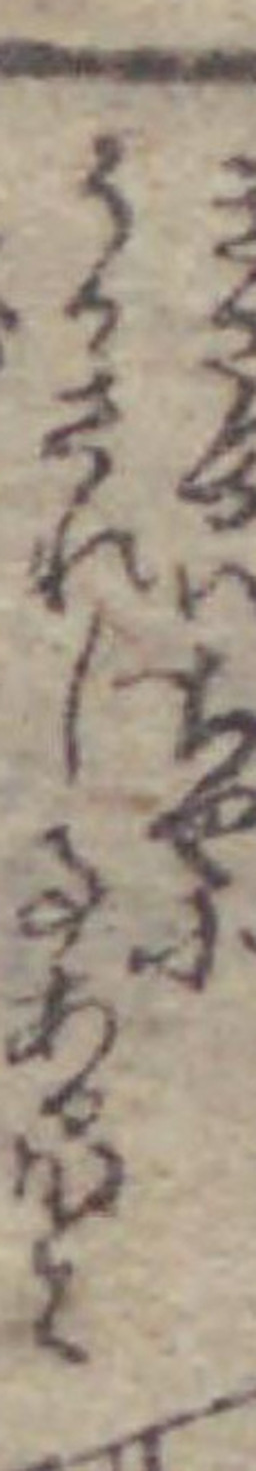うかされし事あるかと
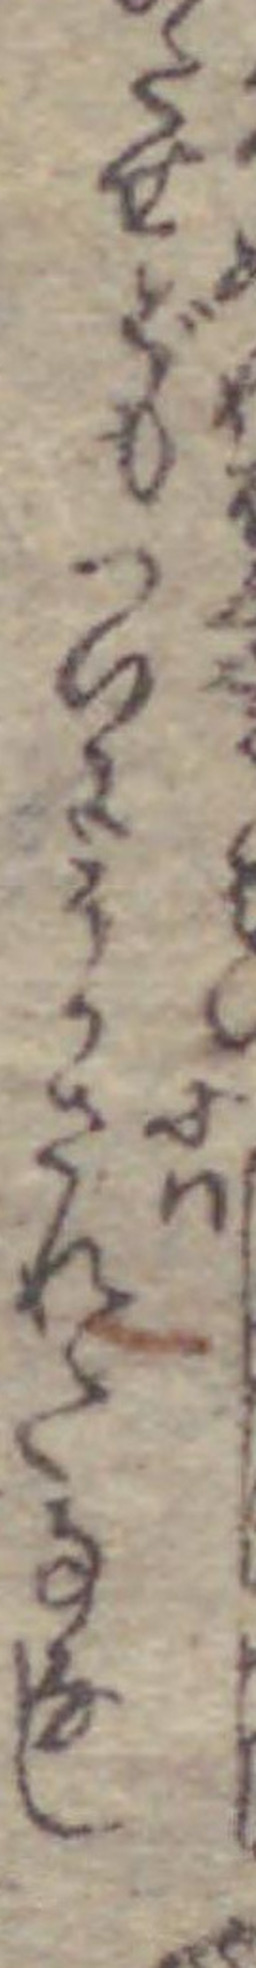いたせどもついにうかされた事なし
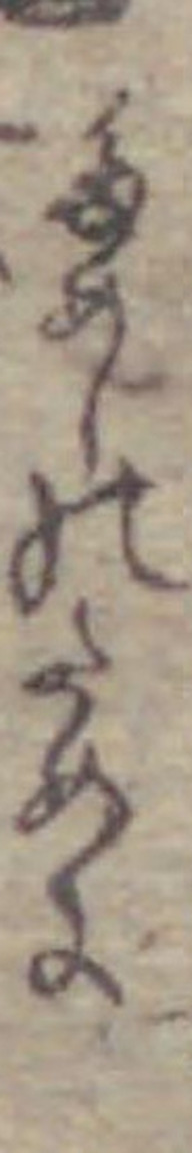ためしのために
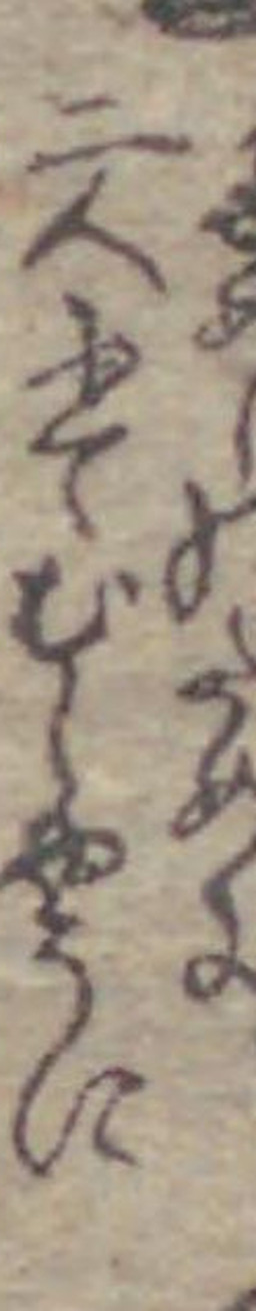二人にてむしやうに
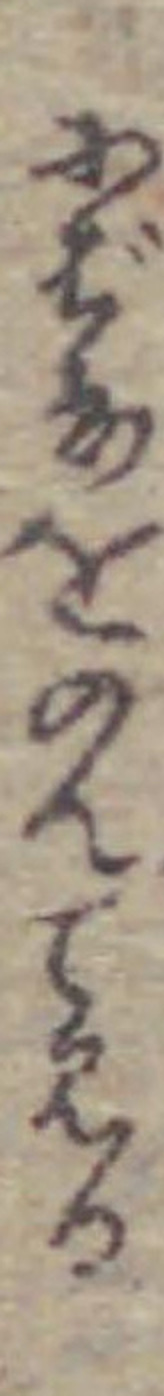にばなをのんてみる
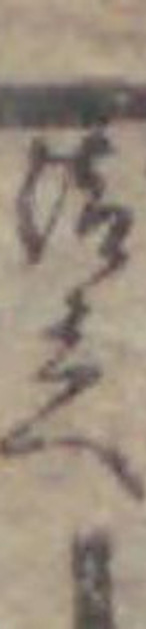清兵へ
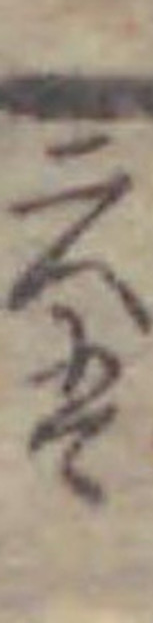二人にて
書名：見通占 : 3巻
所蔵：国立国会図書館 National Diet Library, JAPAN
